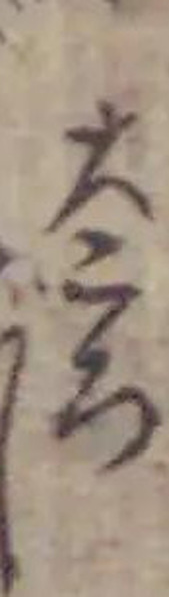大ころ
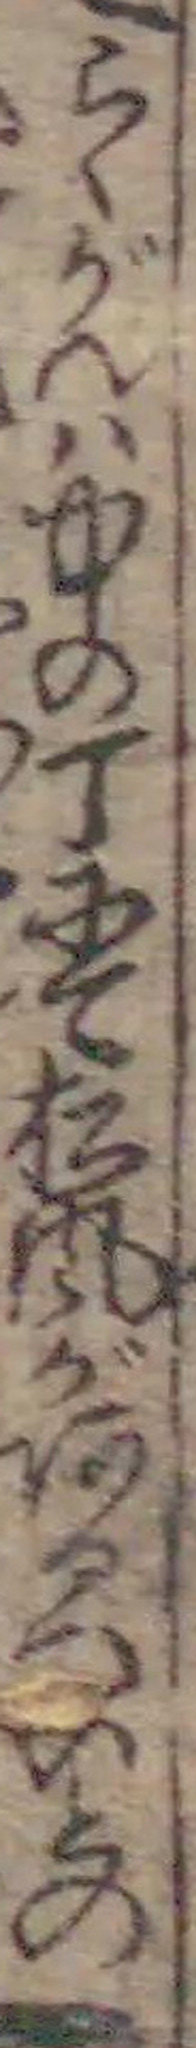らくがんは中の丁にて松風があるへいとの
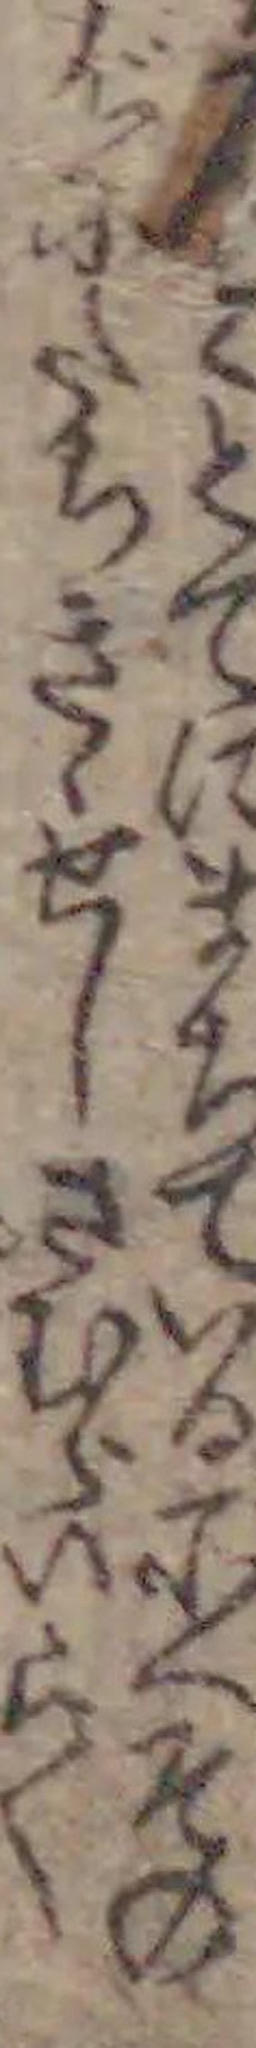ばにたちきゝせしさむらいらく
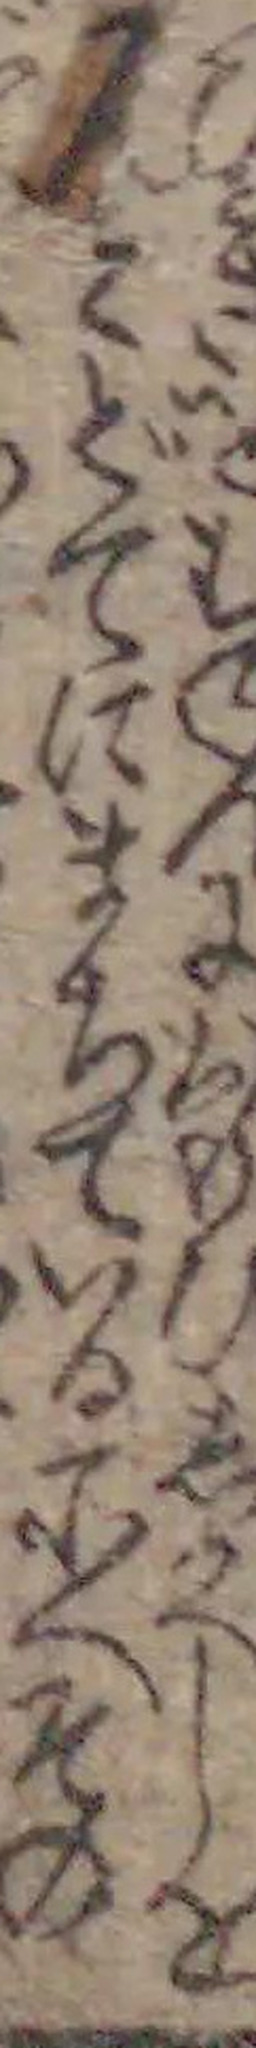せんとどてにまちている所へその
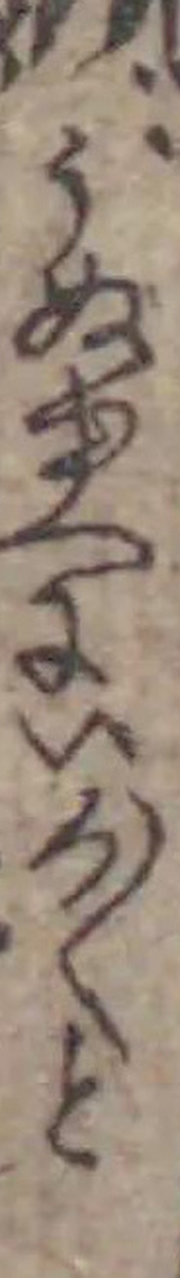うぬゆへにいろ〳〵と
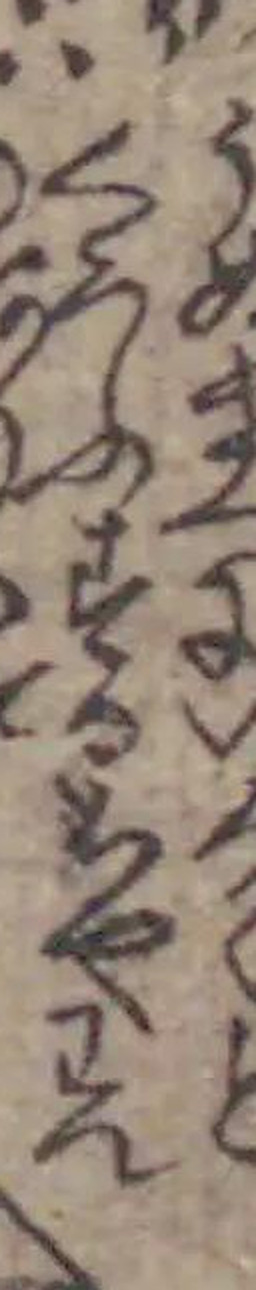くろふするちやわん
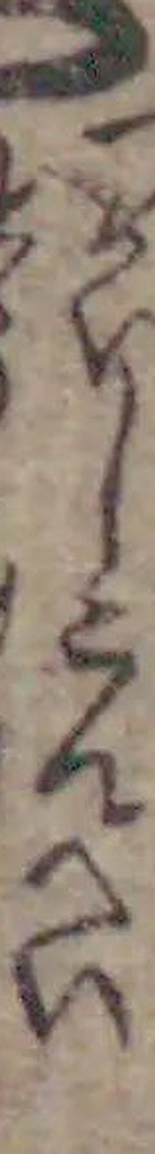つかいしこんへい
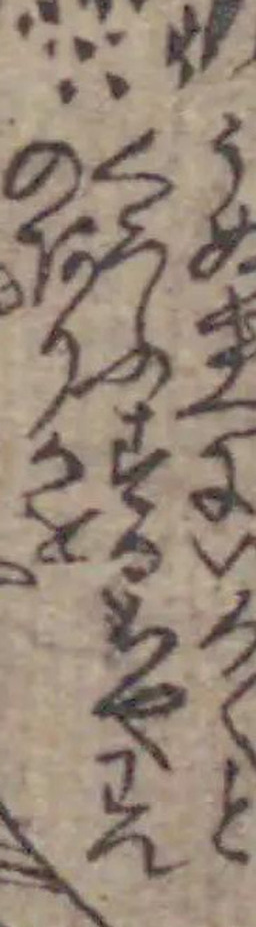くろふするちやわん
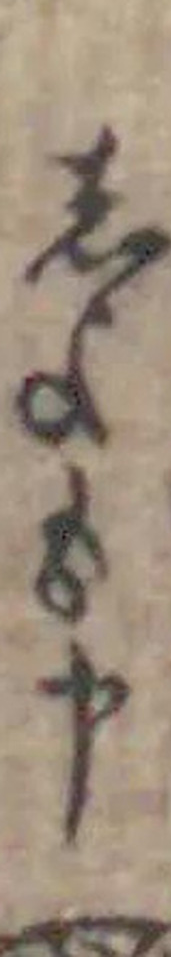しよも申
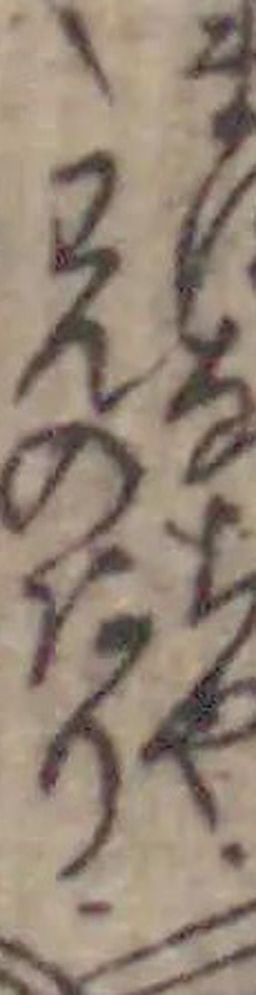わんのあり
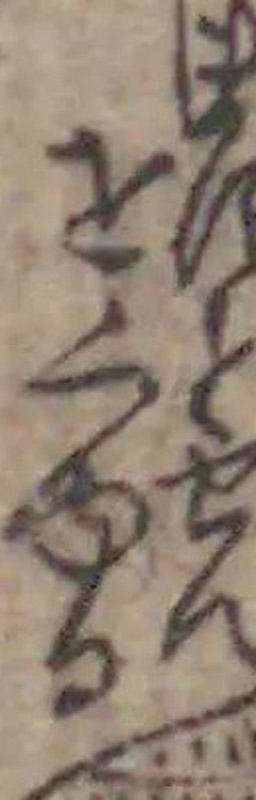をくゆる

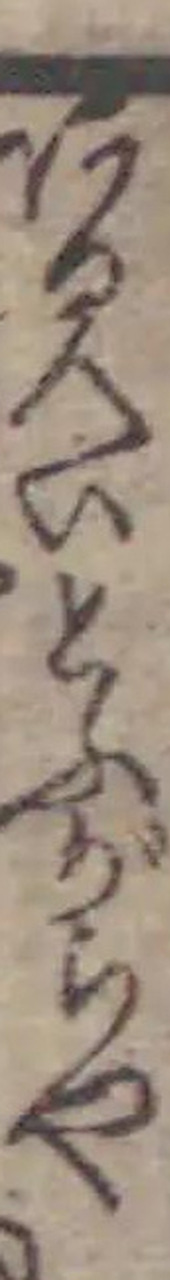あるへいとうがちや
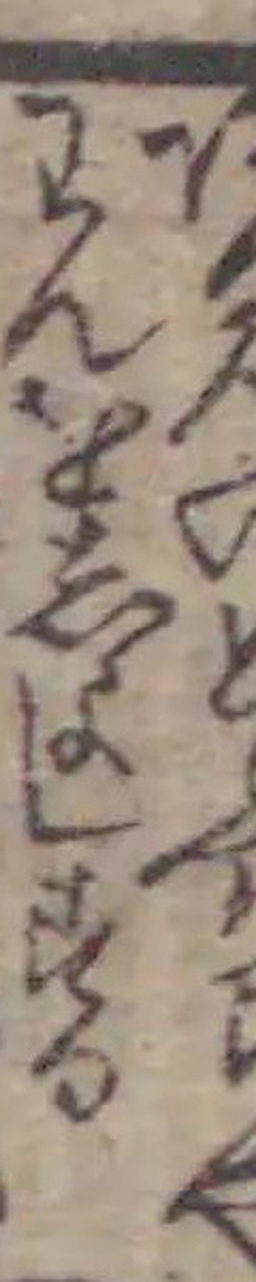わんをしよしする
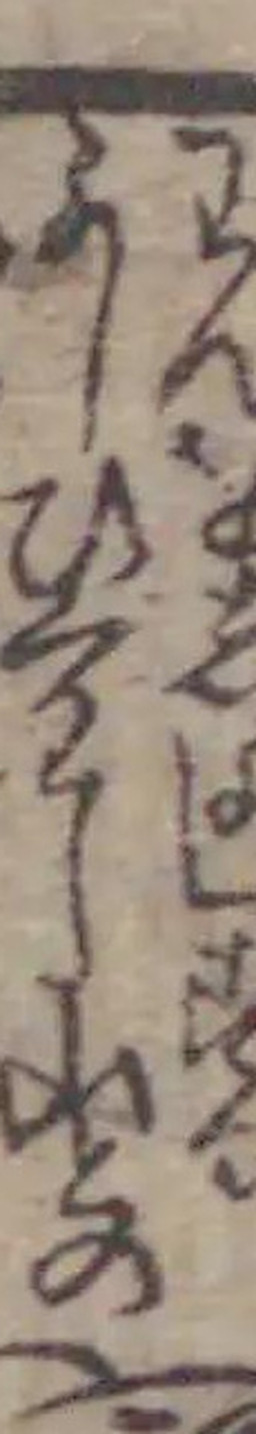よしひくわし山との
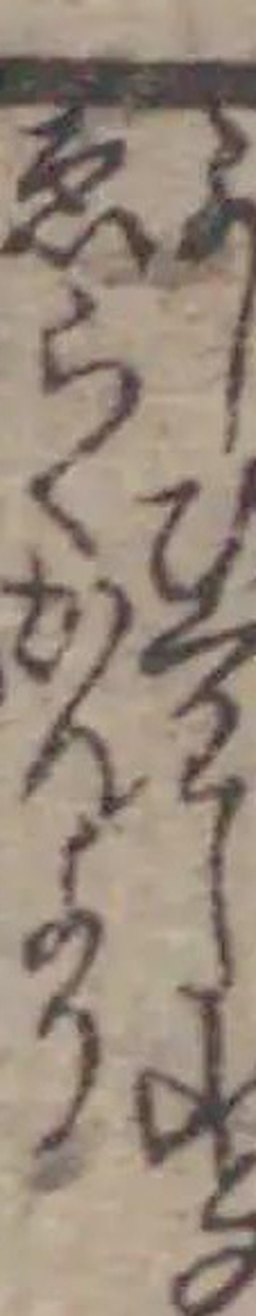ゑらくかんより
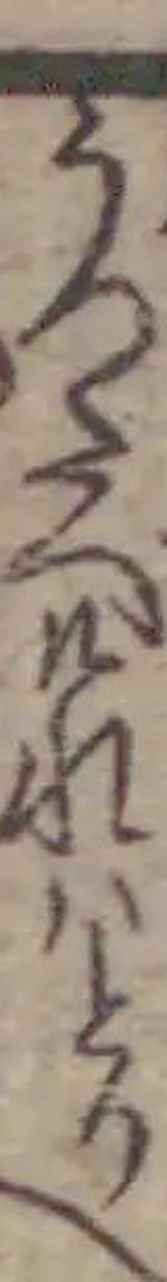うつたへけれはとり
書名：名代干菓子山殿 3巻
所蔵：国立国会図書館 National Diet Library, JAPAN
